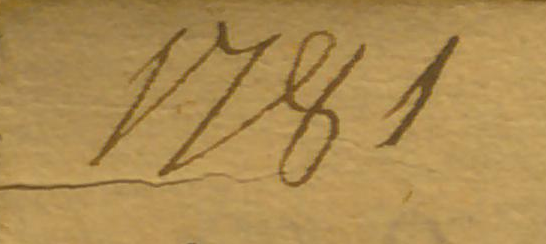1781
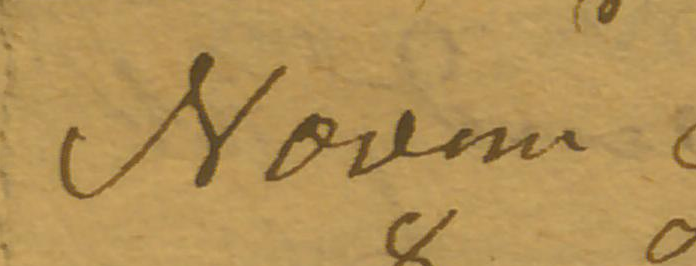Novem^r
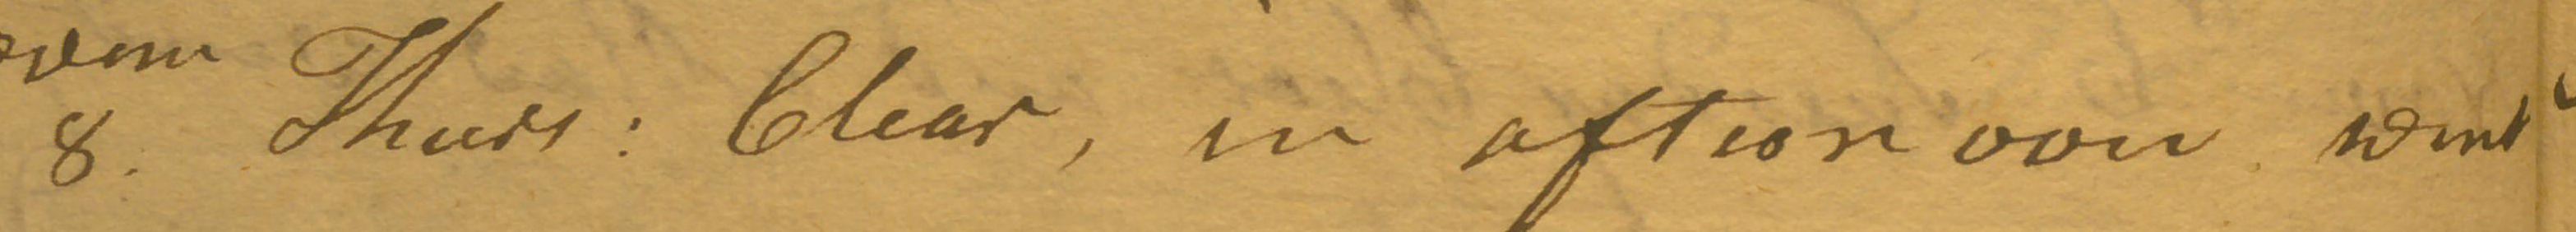8. Thurs: Clear, in afteonoon went
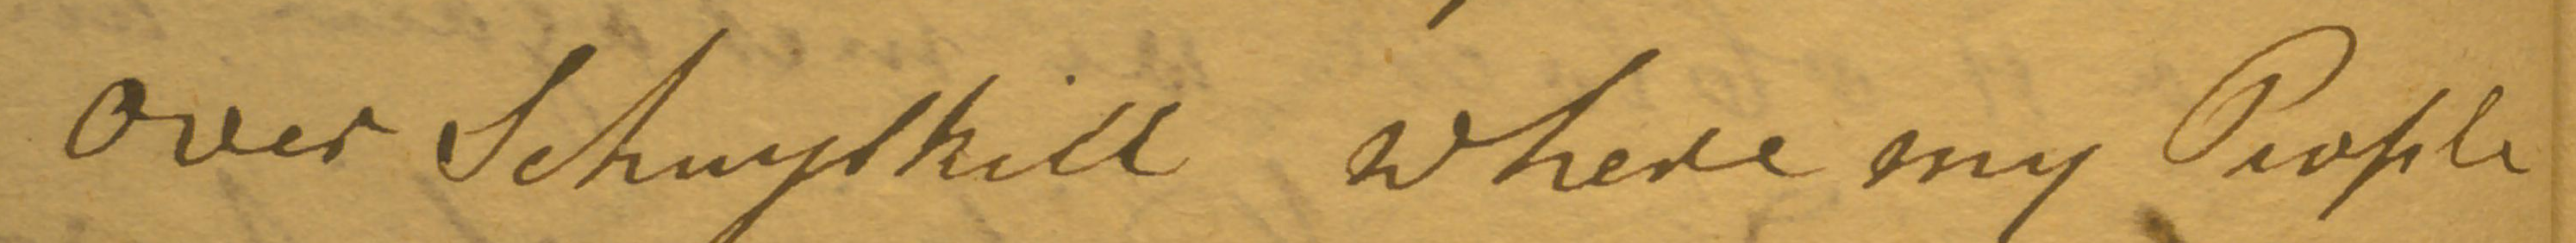over Schuylkill where my People
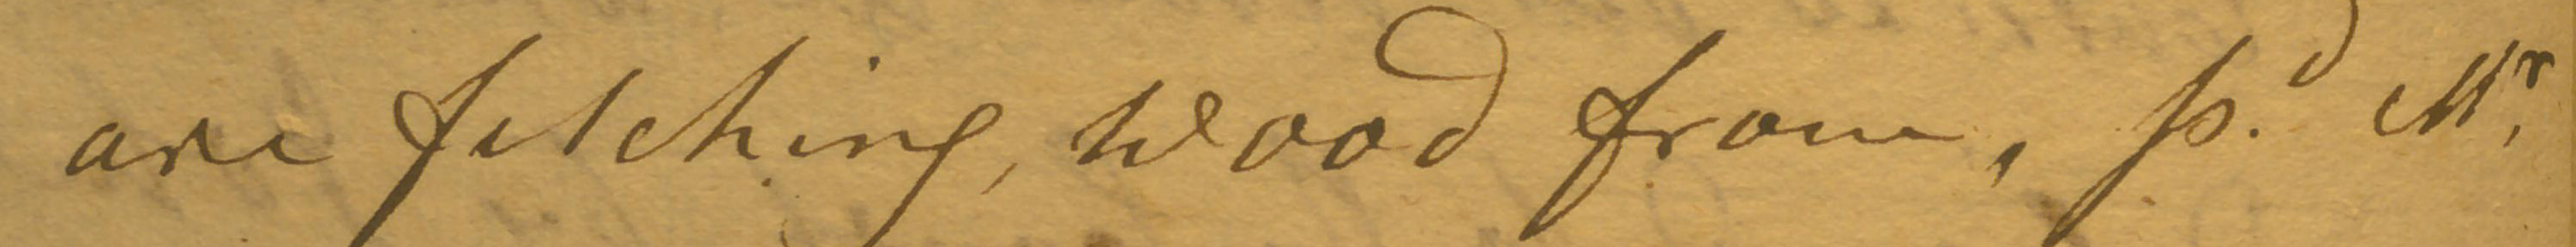are fetching wood from, p^d. M^r.
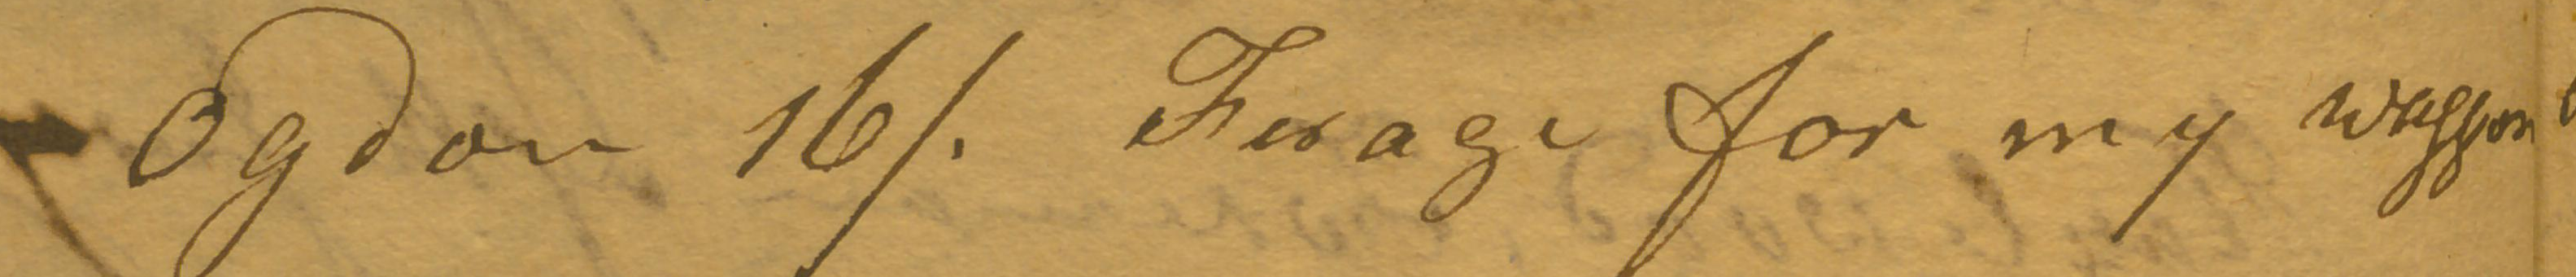Ogdon 16s. Ferage for my waggon
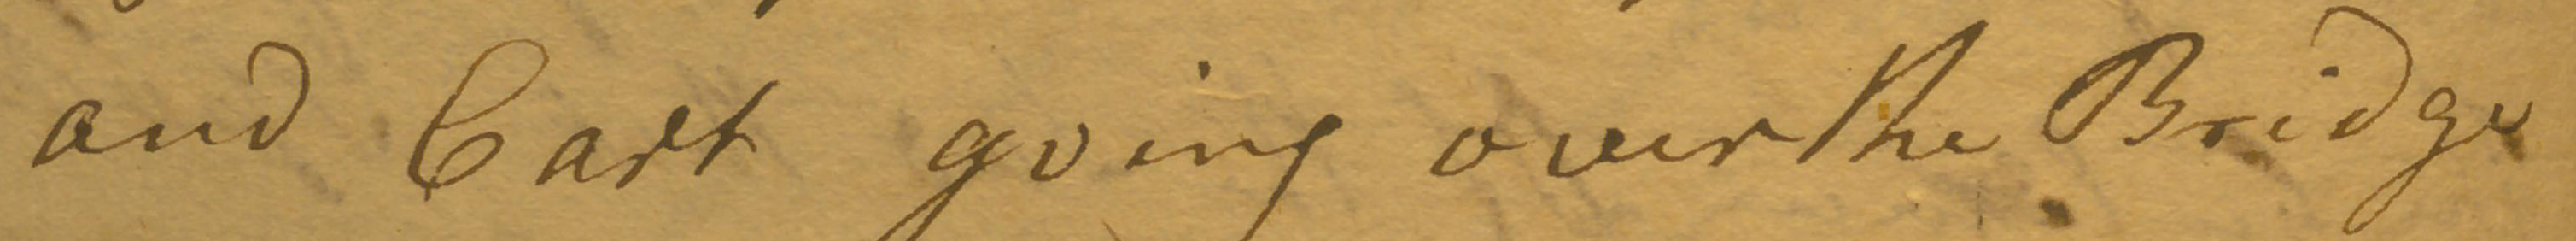Cart going over the Bridge
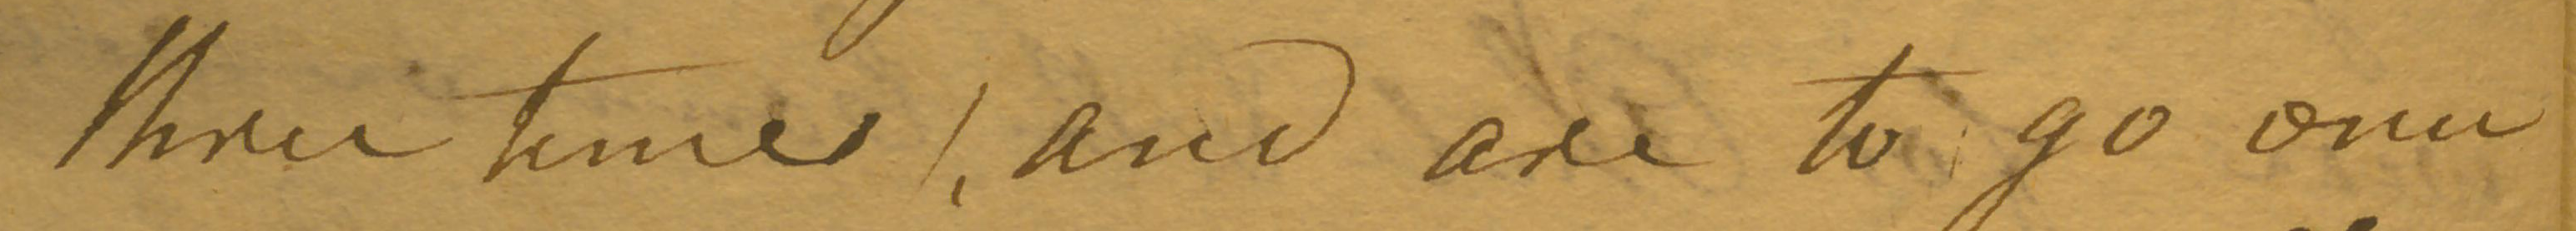three times / and are to go once
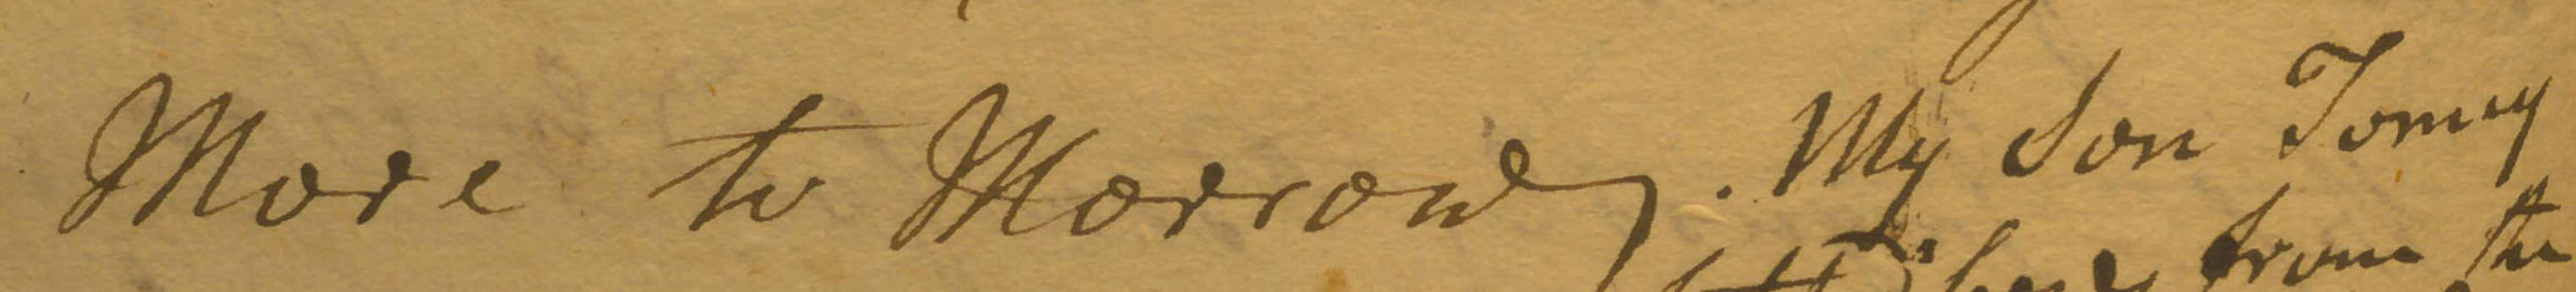More to Morrow. My Son Tomey
